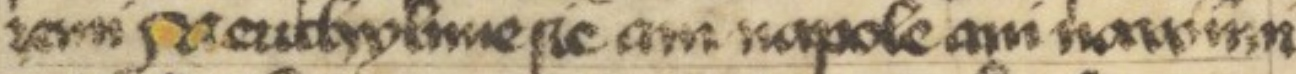zemi Neuchylime ſie ani napole ani nawinn
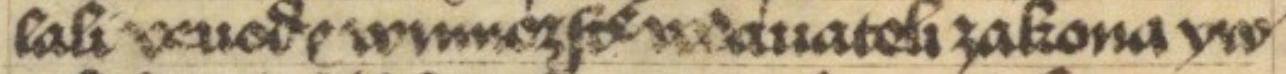lali veuod winnozſte wdauateli zakona yw-
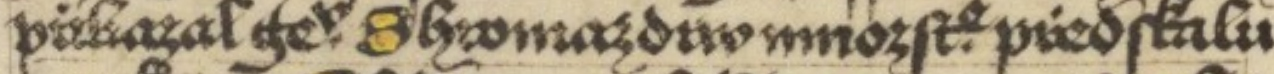pṙikazal ge.v Shromazdiw mnozſt.e pṙedſkalu
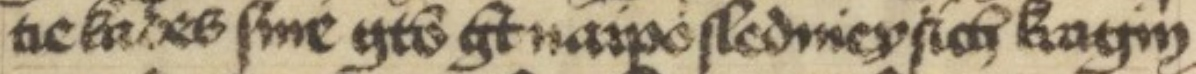tie kades ſme g̑to g̑t naiꝑoſlednieyẛich kragin
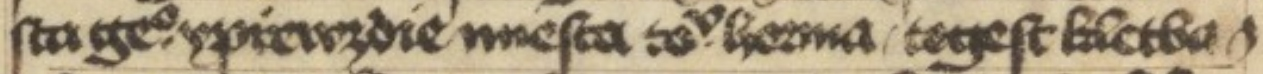ſta ge.° ypṙewzdie mieſta to.v horma togeſt kletba
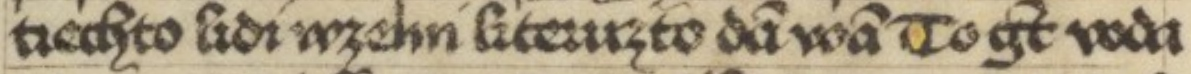tiechto lidi wzemi kteruzto dȃ wȃ To g̑t voda
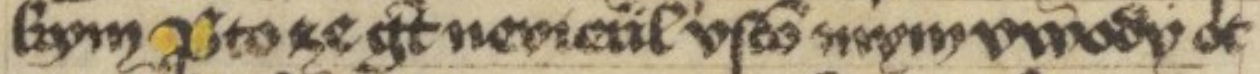kym Pto ze g̑t nevieṙil vſtȏ mym vwody ot-
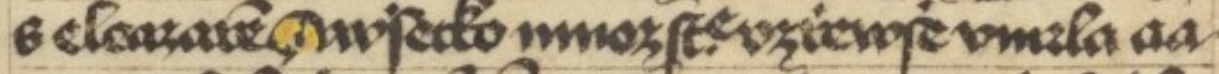s eleazarȇ Awẛecko mnozſt.e vzṙewẛe vmrla aa
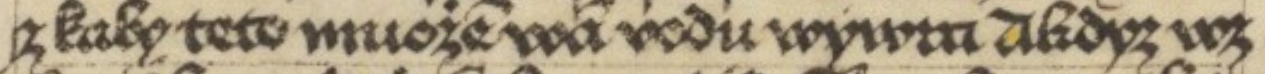z kaby teto muożē wȃ vodu wywrci Akdyz wz
